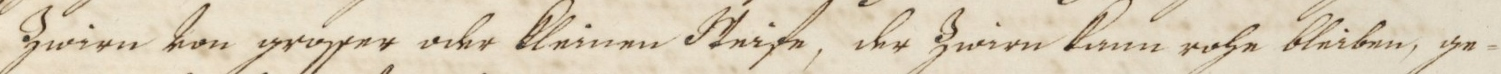Zwirn von grosser oder kleinen Weife, der Zwirn kann rohe bleiben, ge-
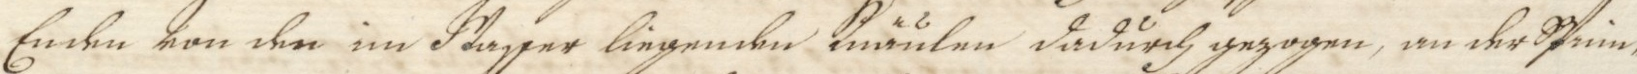Enden von den im Wasser liegenden Knäulen dadurch gezogen, an der Spinn-
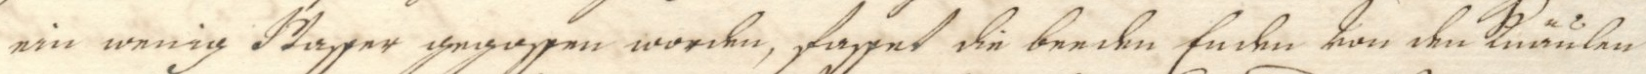ein wenig Wasser gegossen worden, fasset die beeden Enden von den Knäulen
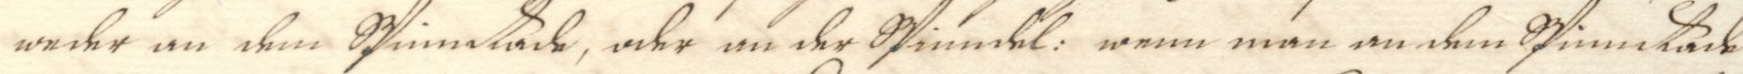weder an dem SpinnRade, oder an der Spinndel: wenn man an dem SpinnRade
